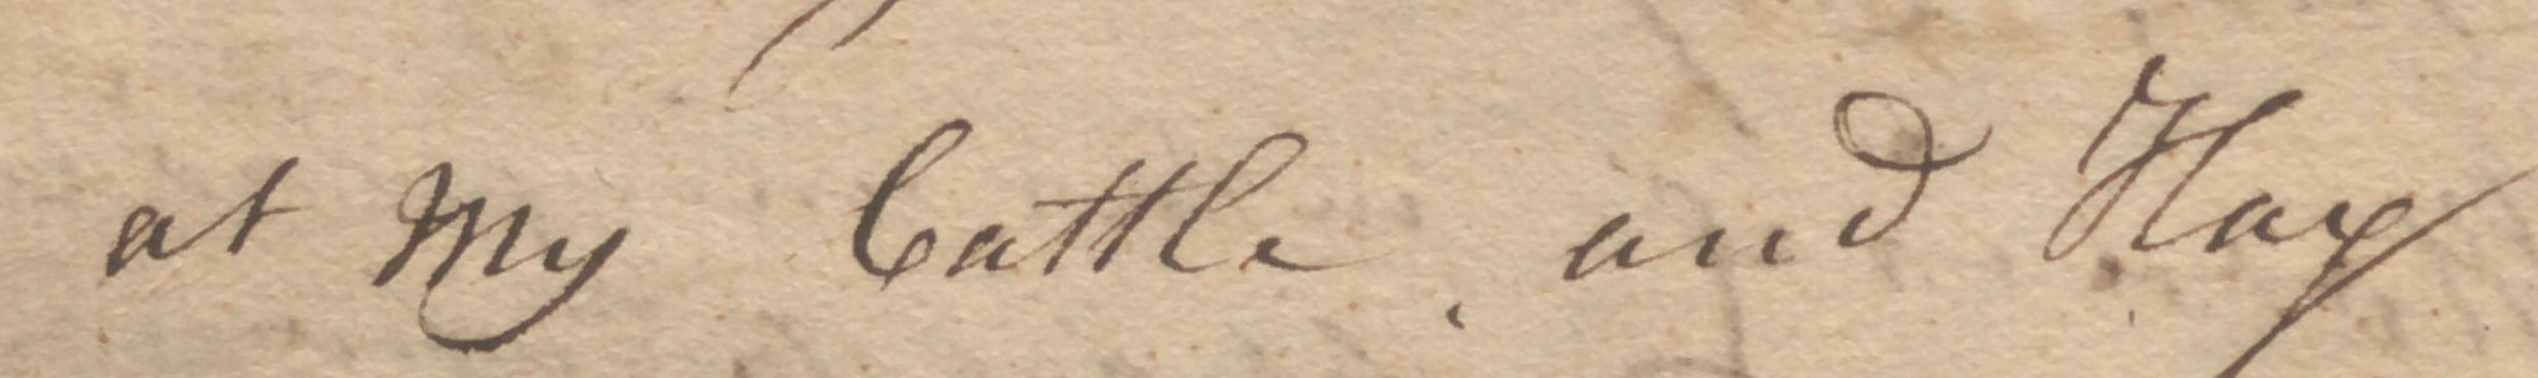at My Cattle and Hay
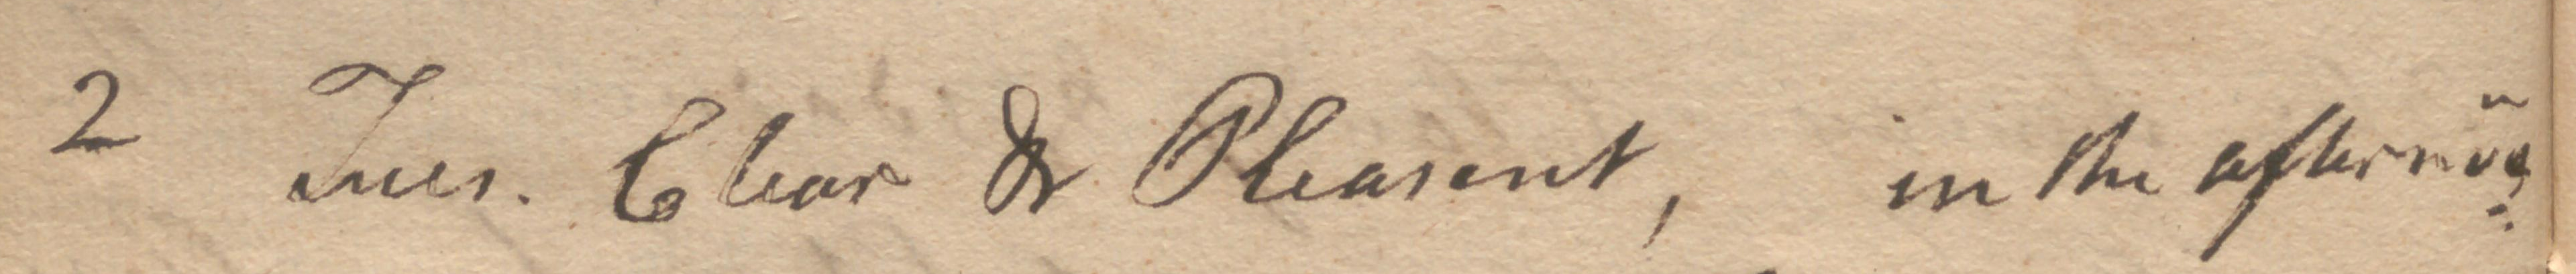2 Tues. Clear & Pleasent, in the afternoo^n
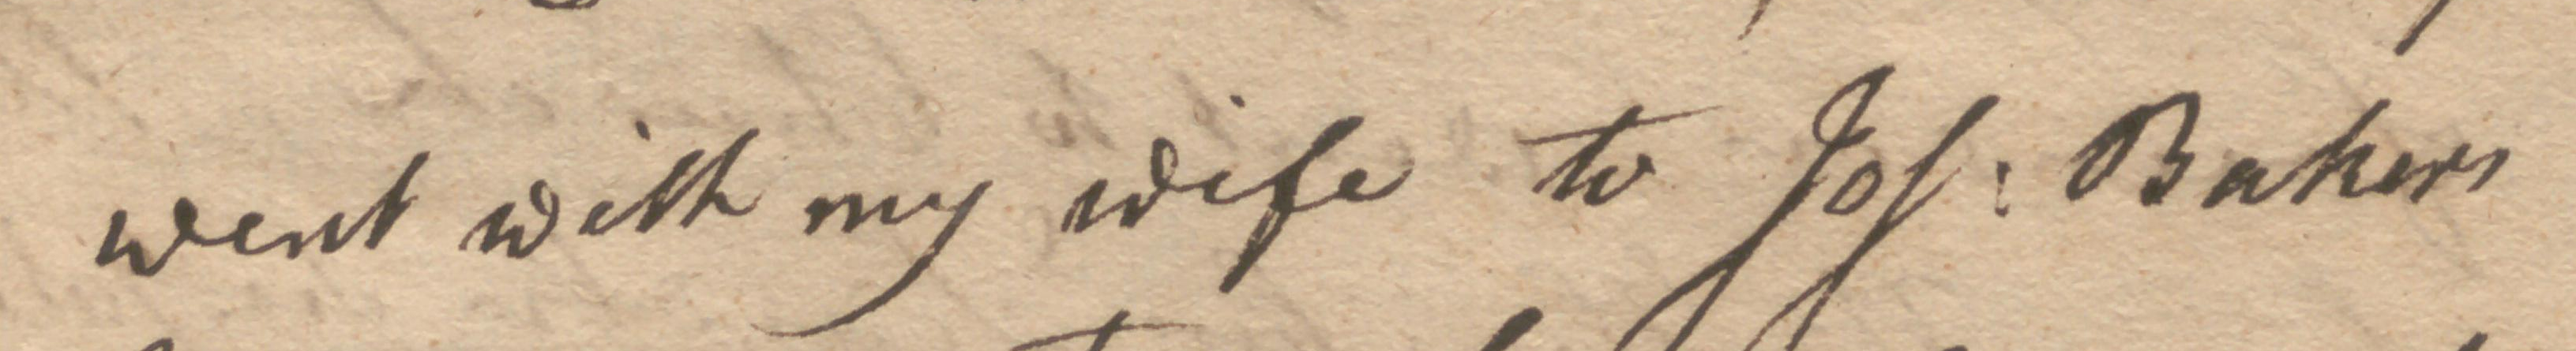went with my wife to Jos: Bakers
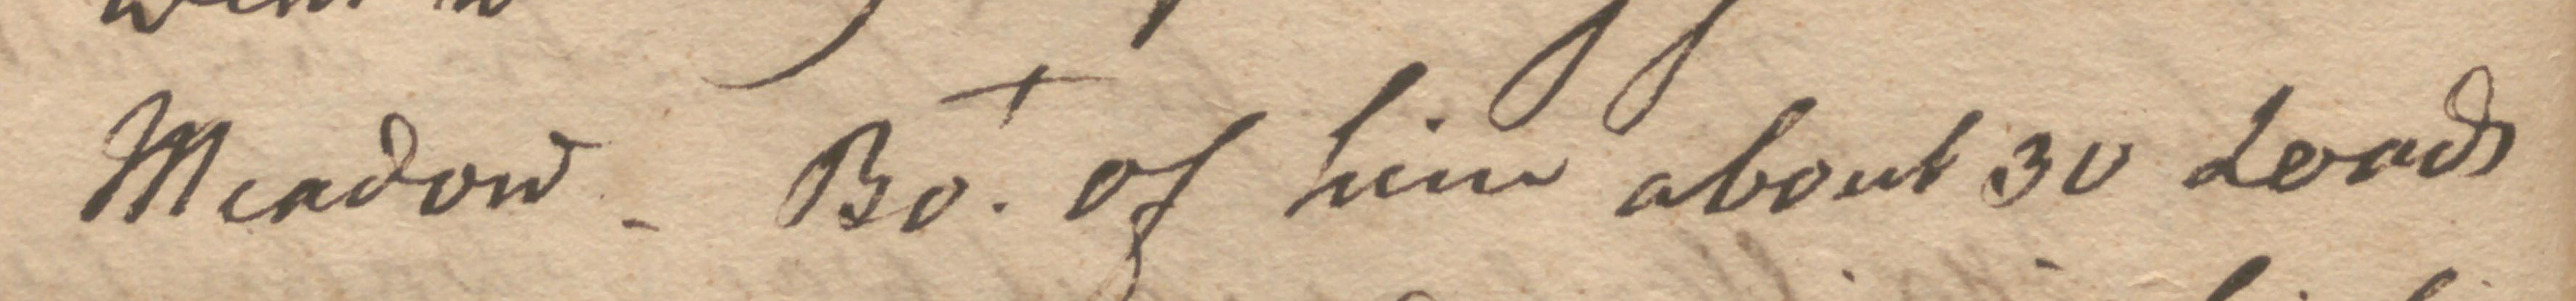Meadow Bo^t. of him about 30 Loads
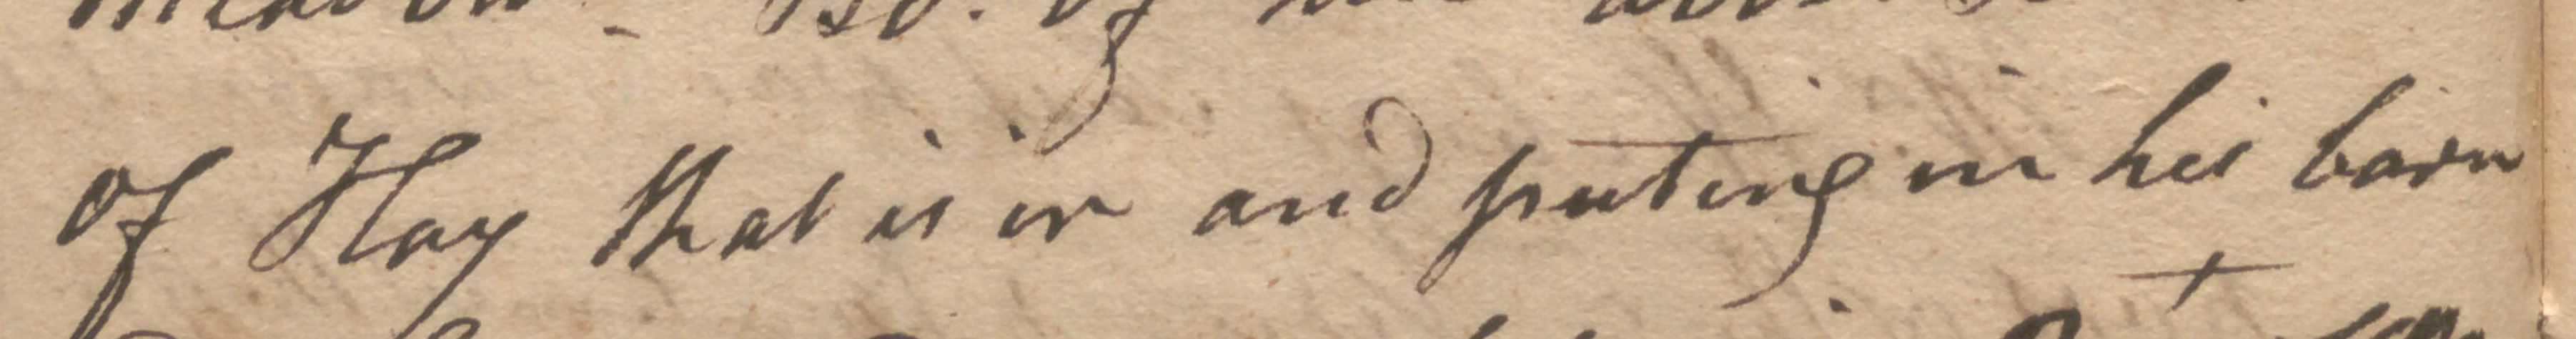of Hay that is in and puting in his barn
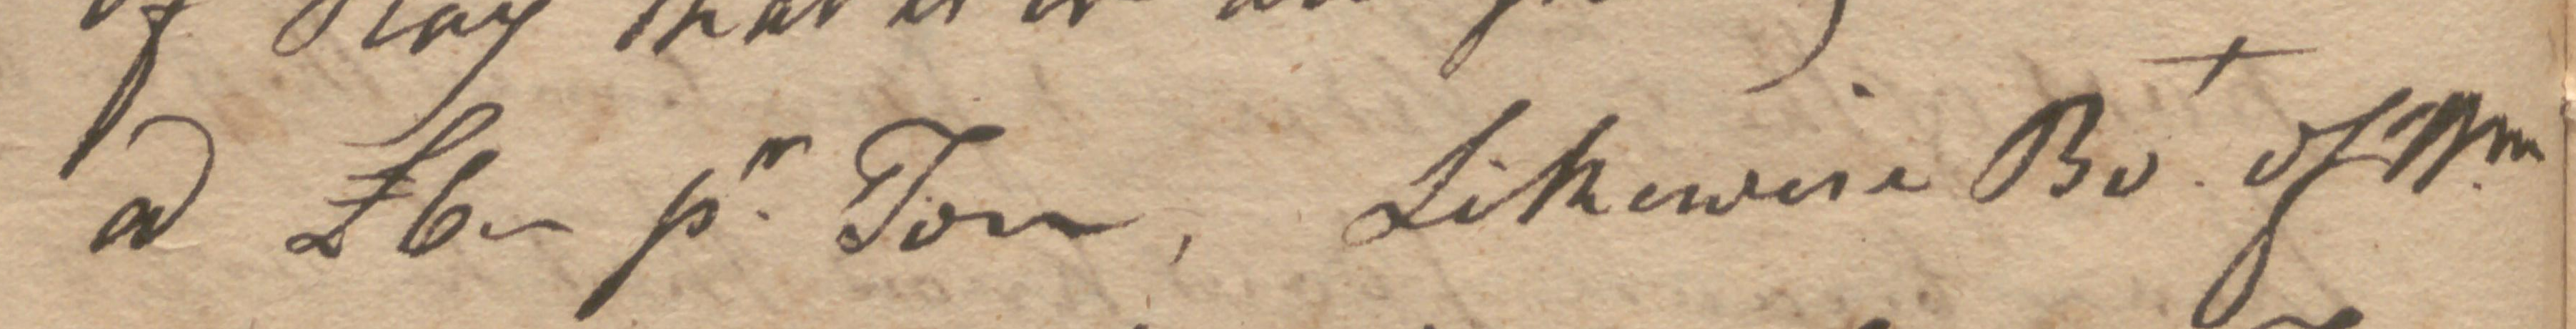@ £6- p^r. Ton, Likewire Bo^t. of W^m.
